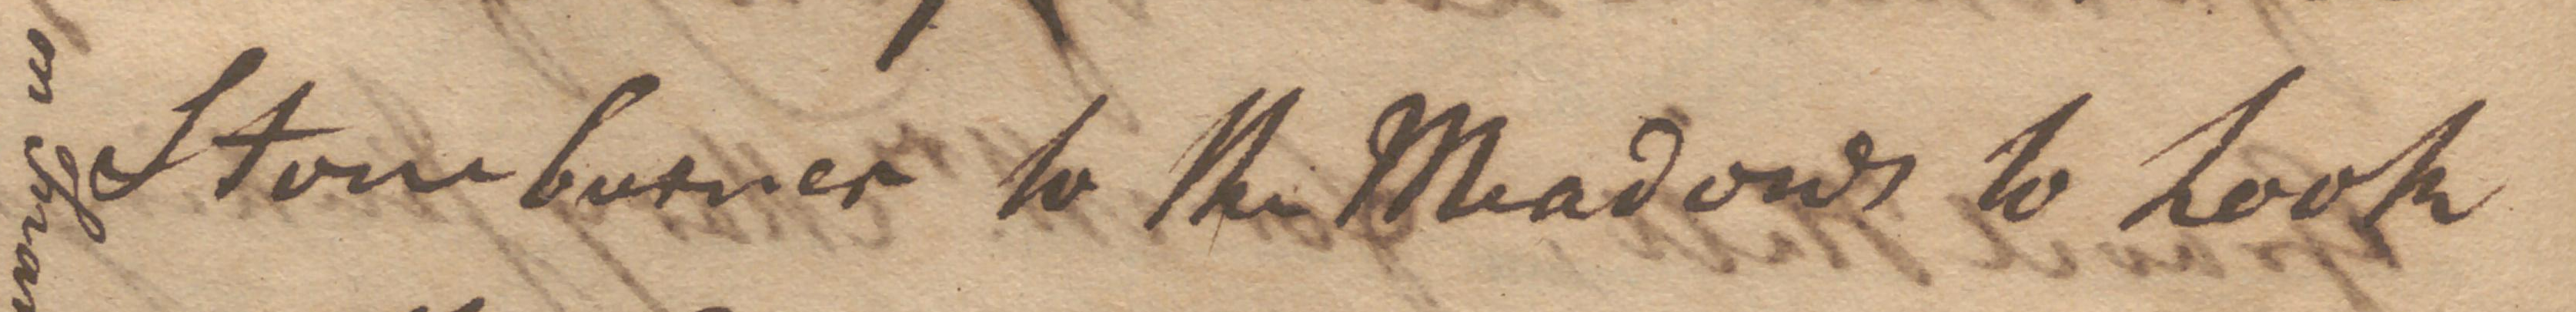Stoneburner to the Meadows to Look
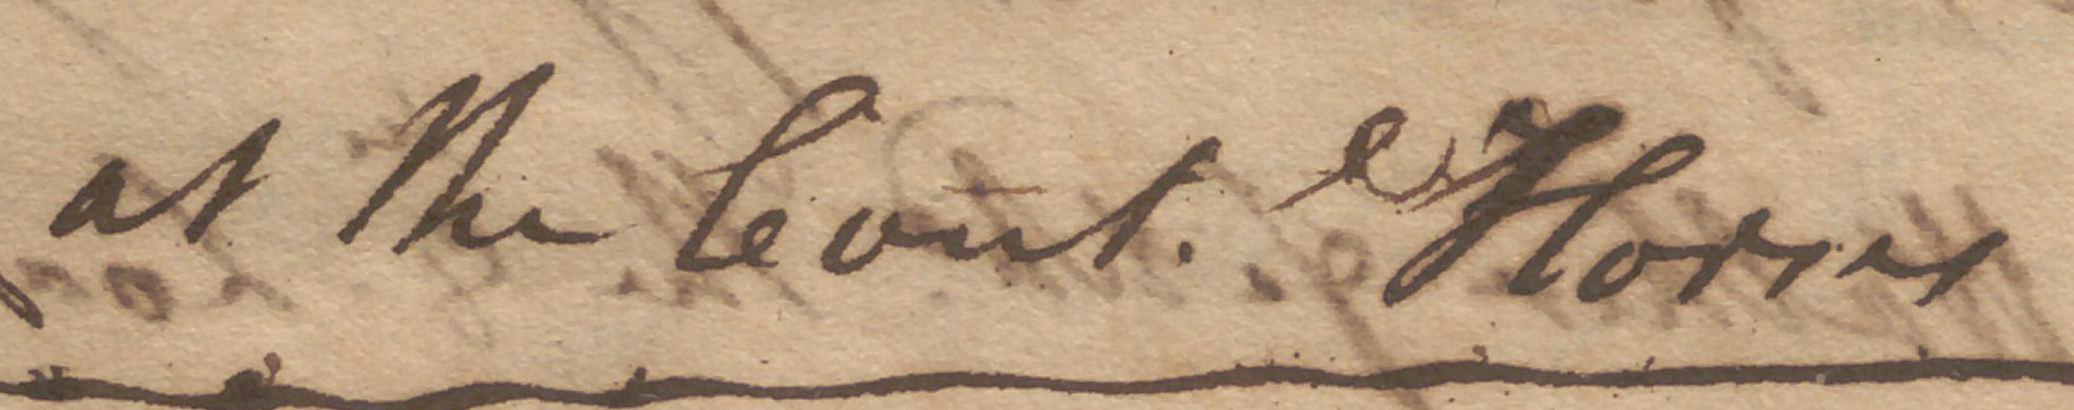at the Cont^l. Horses
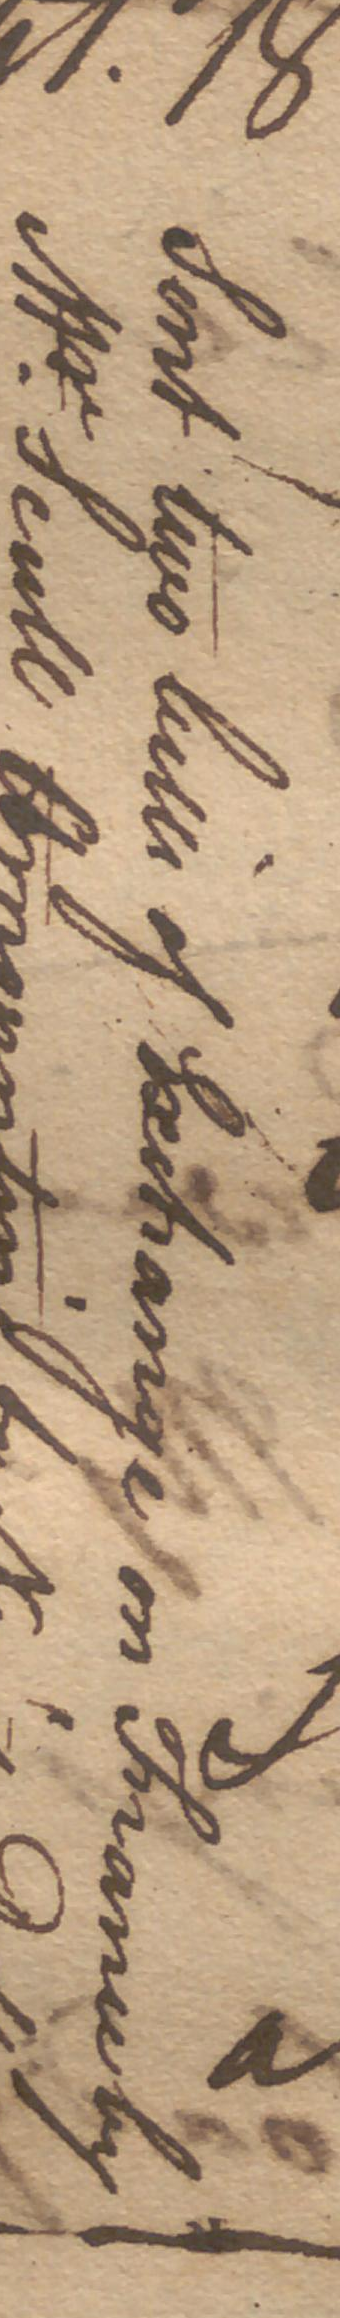Sent two bills of Exchange on France by
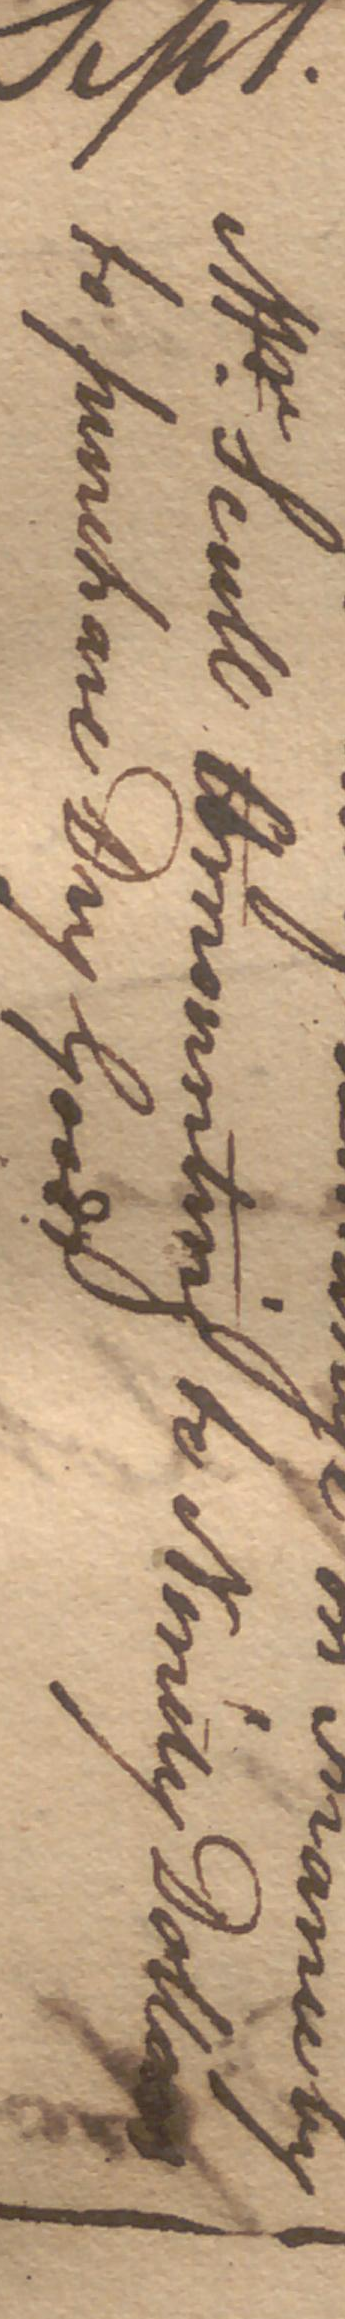M^r Scull Amounting to Ninety Dollars
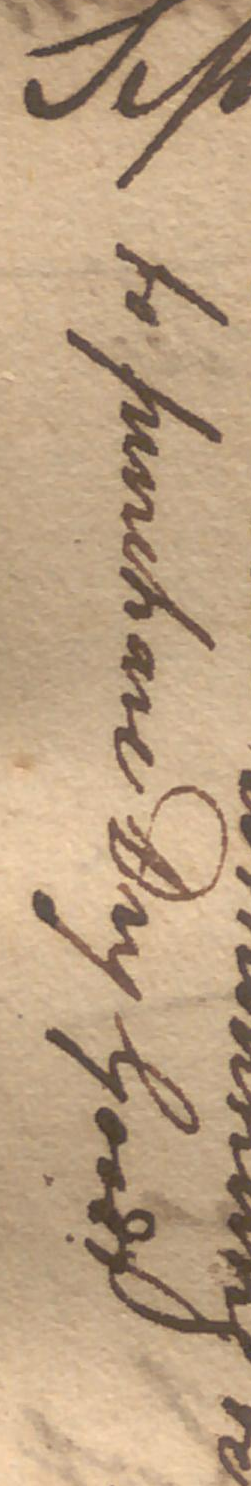to purchase Dry Goods
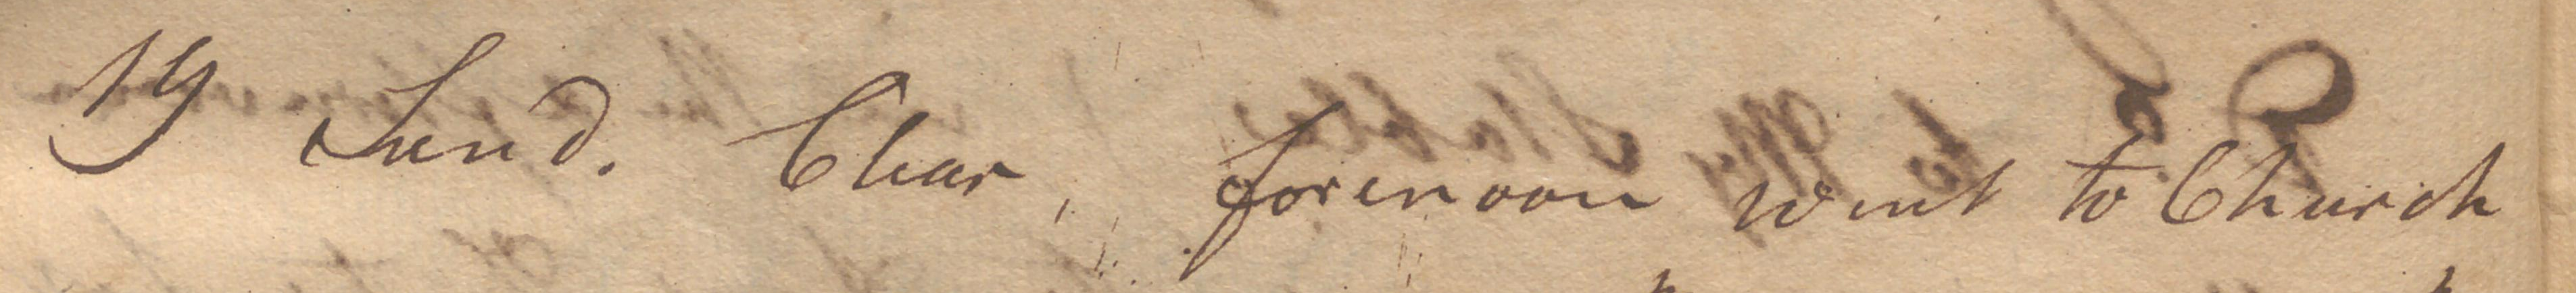19 Sund. Clear, forenoon went to Church
